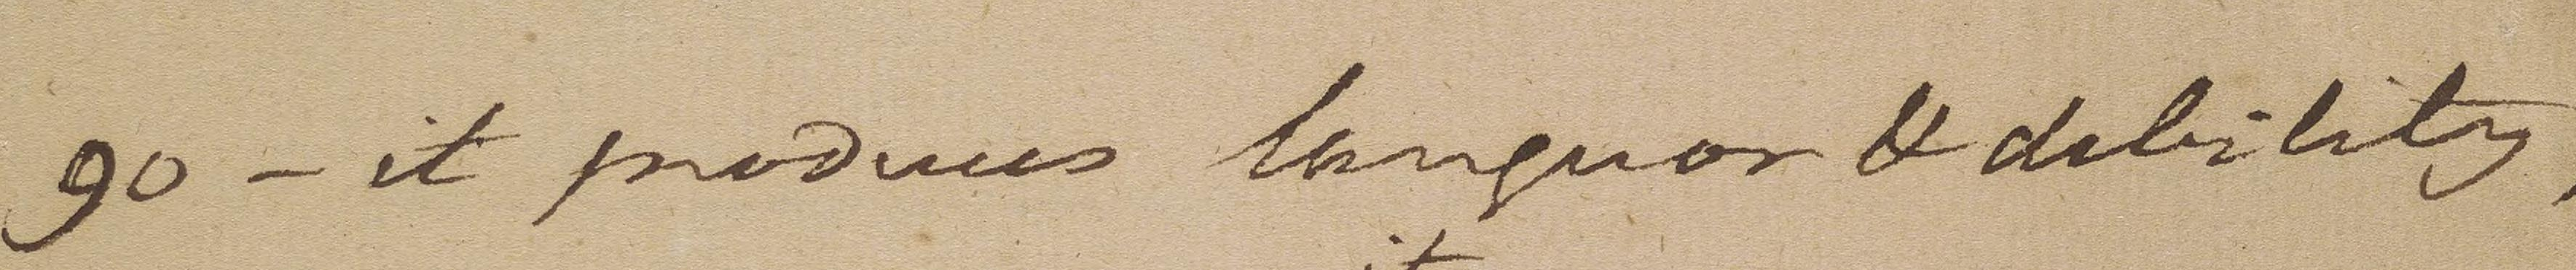90 it produces languor & debility
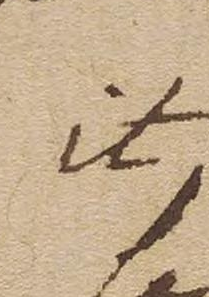it
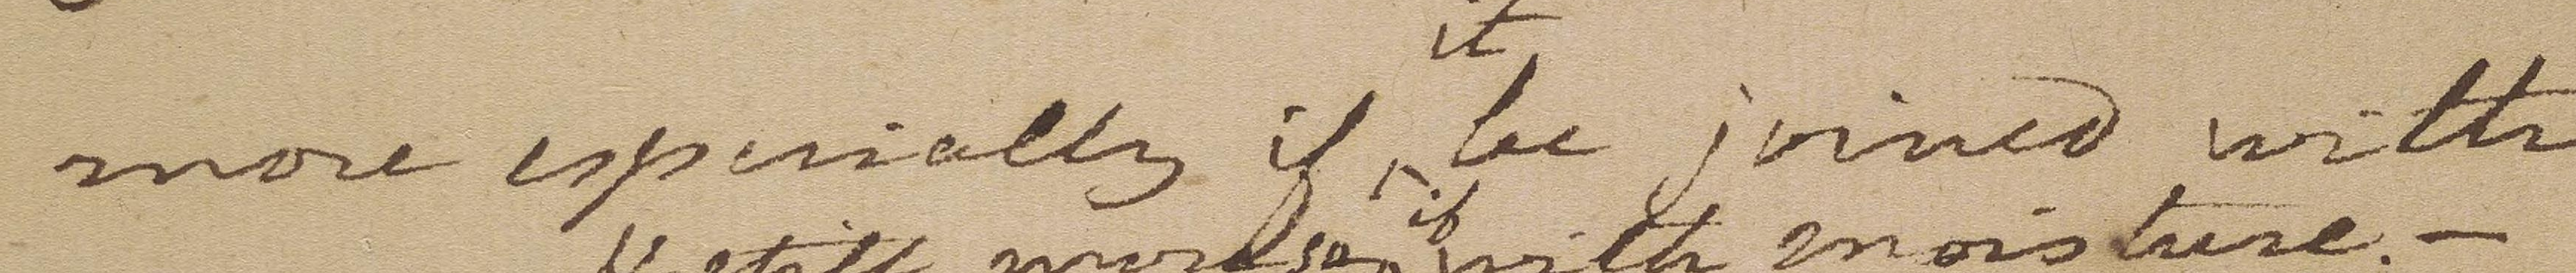more especially if ^ be joined with
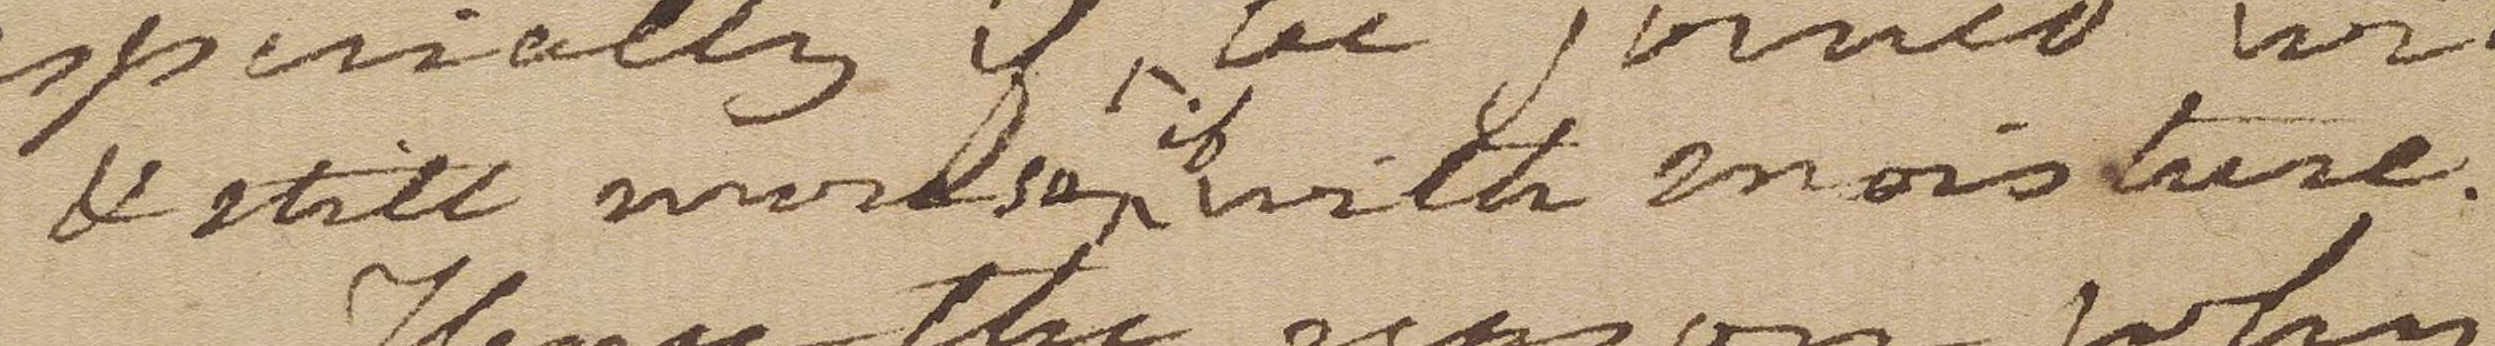& still moreso ^if with moisture
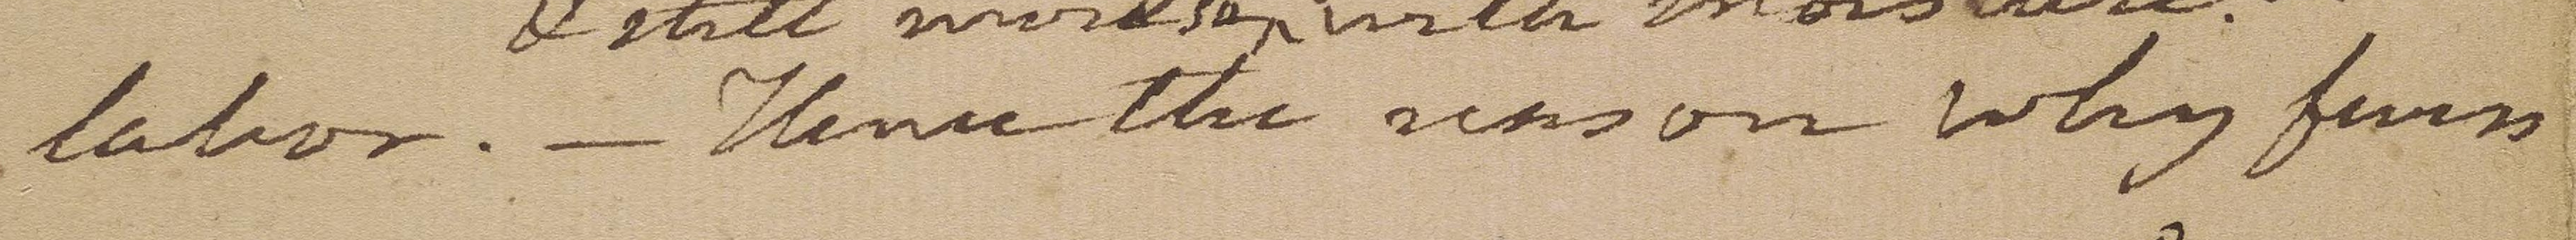labor Hence the reason why fevers
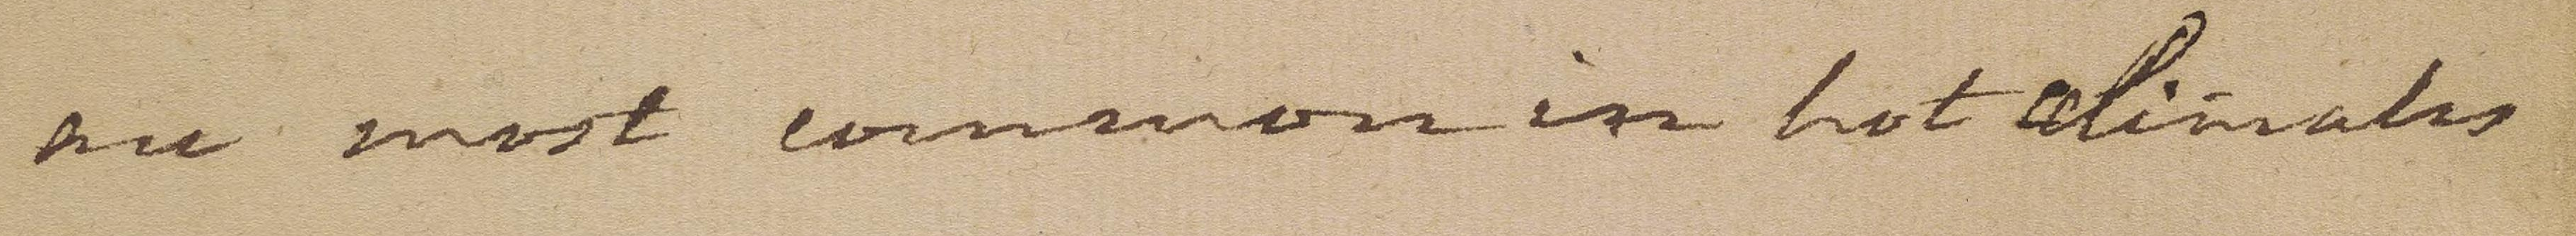are most common in hot climates
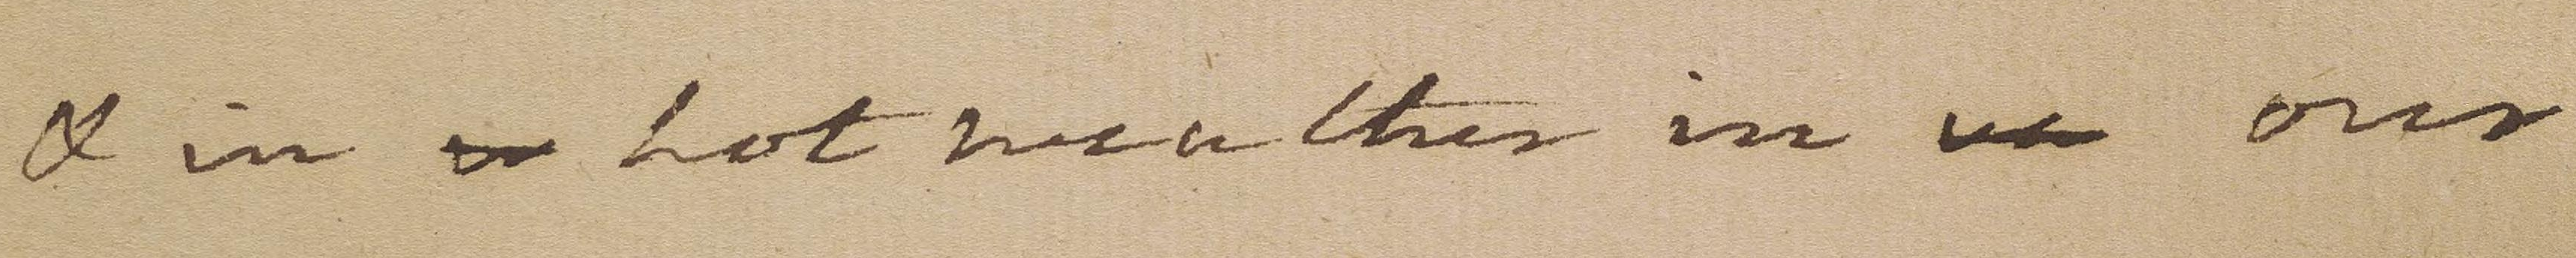& in hot weather in our
